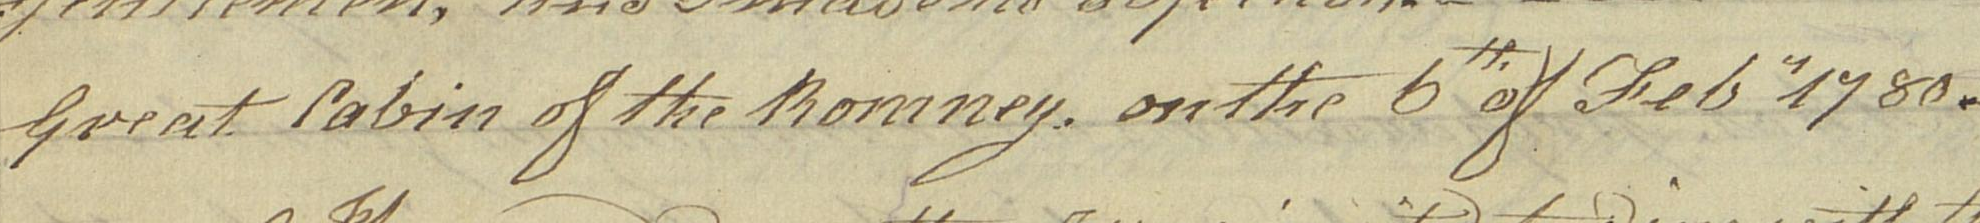Great Cabin of the Romney on the 6^th of Feb^y 1780
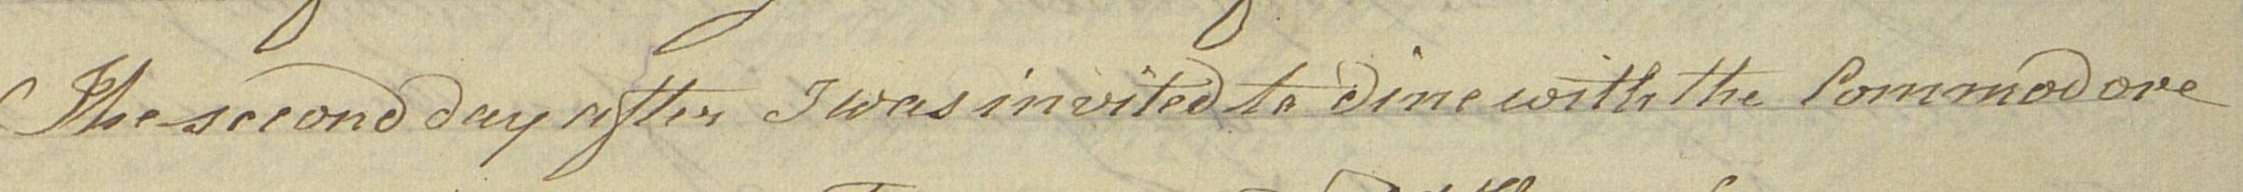The second day after I was invited to dine with the Commodore
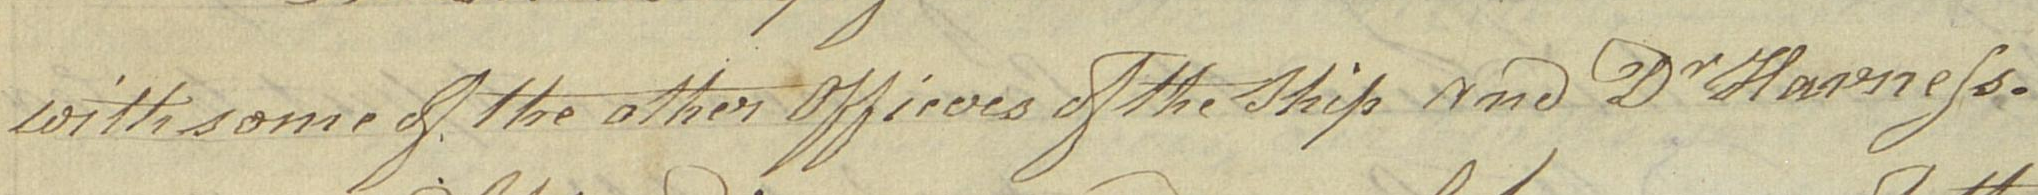with some of the other Officers of the Ship and D^r Harness.
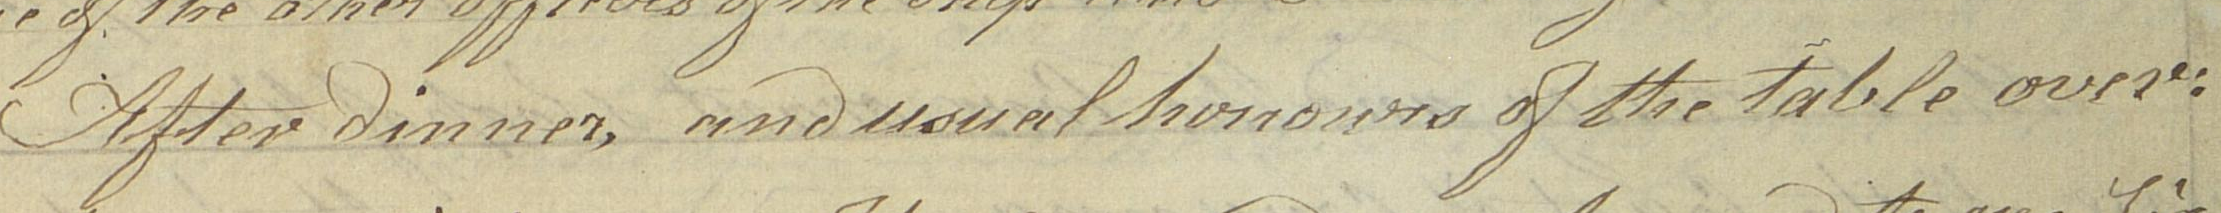After dinner, and usual honours of the table over:
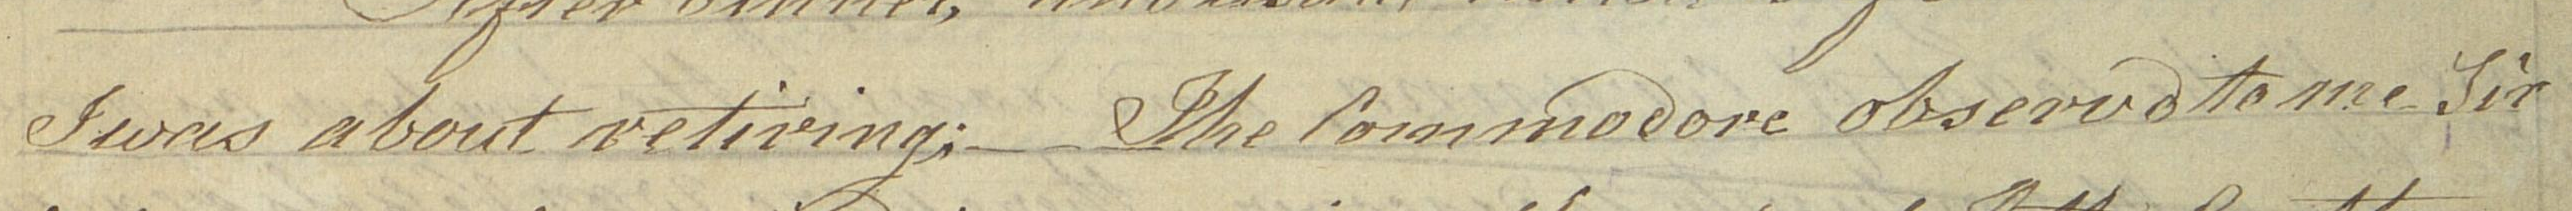I was about retiring; The Commodore observd to me Sir
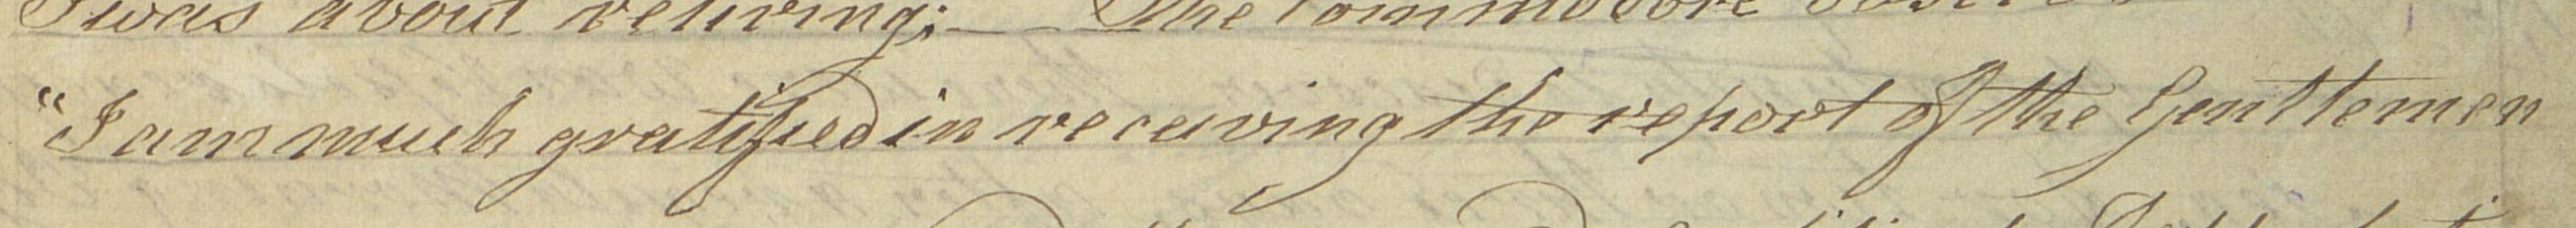"I am much gratified in receiving the report of the Gentlemen
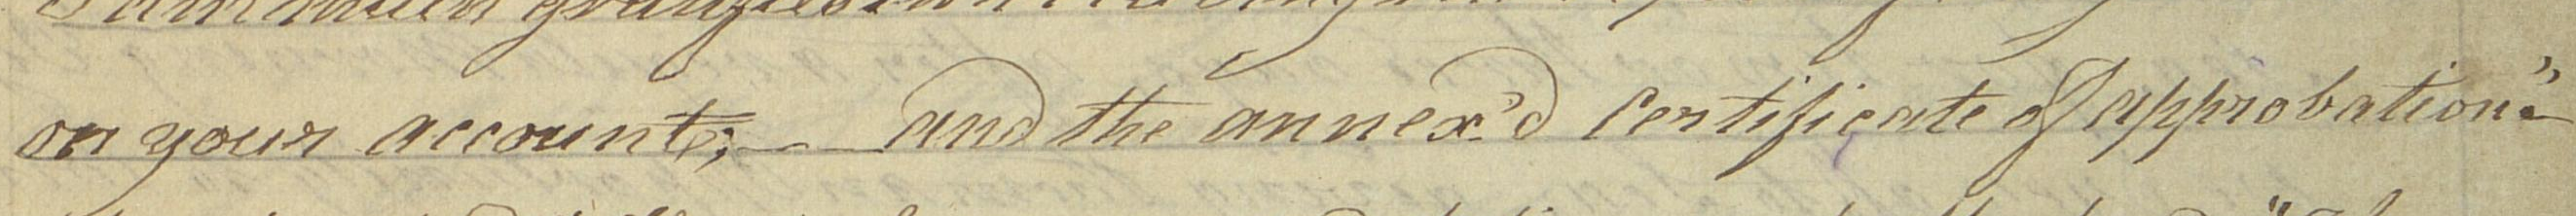on your account; and the annex'd Certificate of approbation."
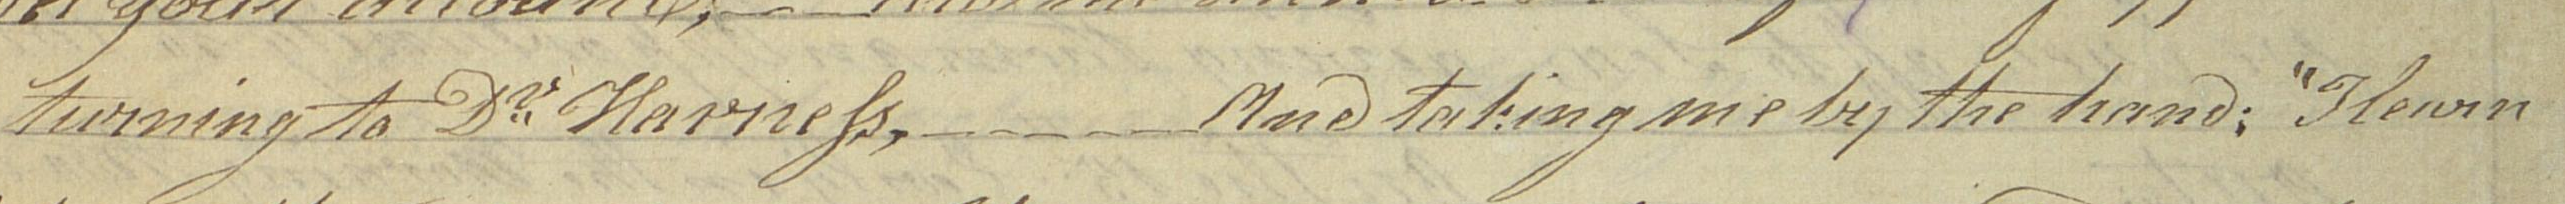turning to D^r. Harness, And taking me by the hand; "I learn
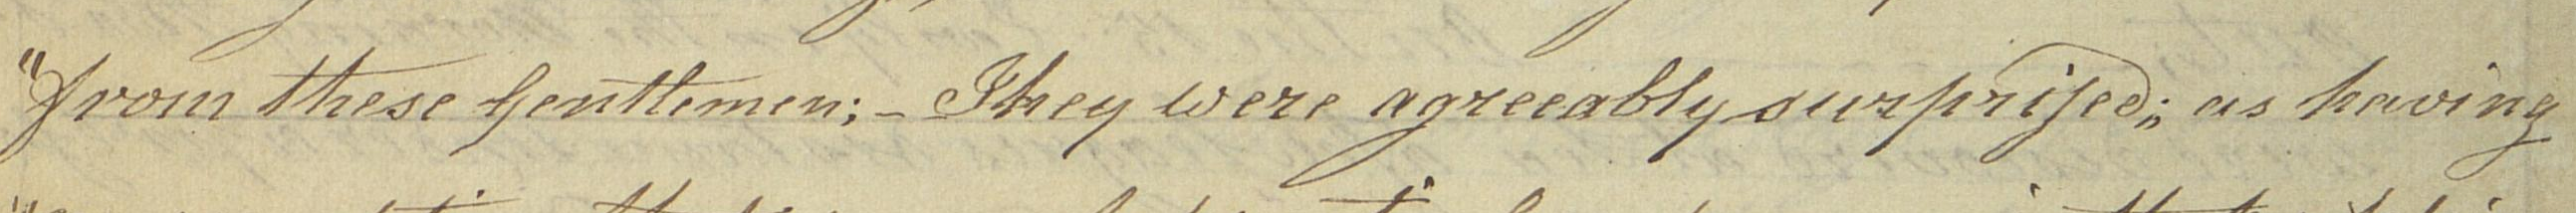"from these Gentlemen; They were agreeably surprised; as having
